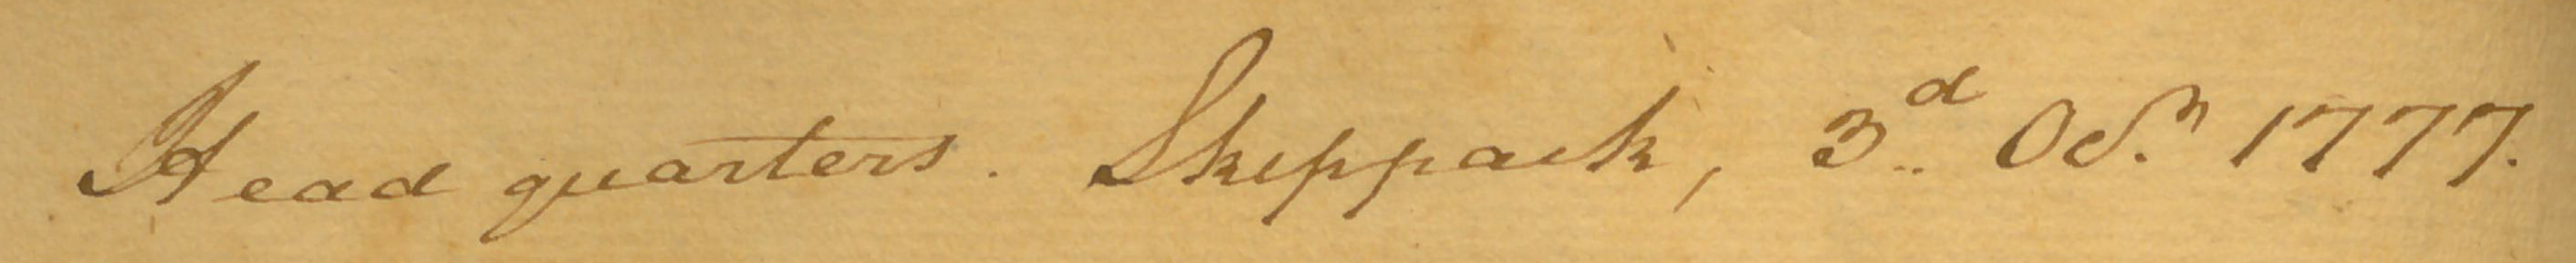Head quarters. Skippack, 3^d Oc^r. 1777.
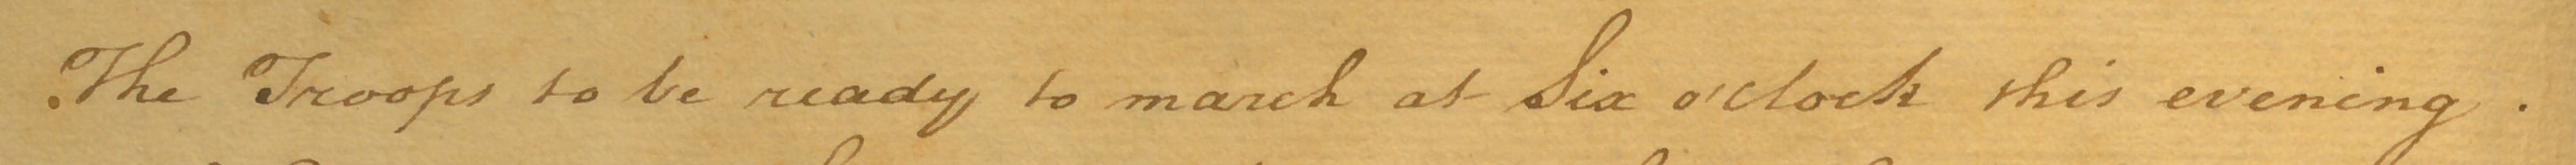The Troops to be ready to march at Six o'clock this evening.
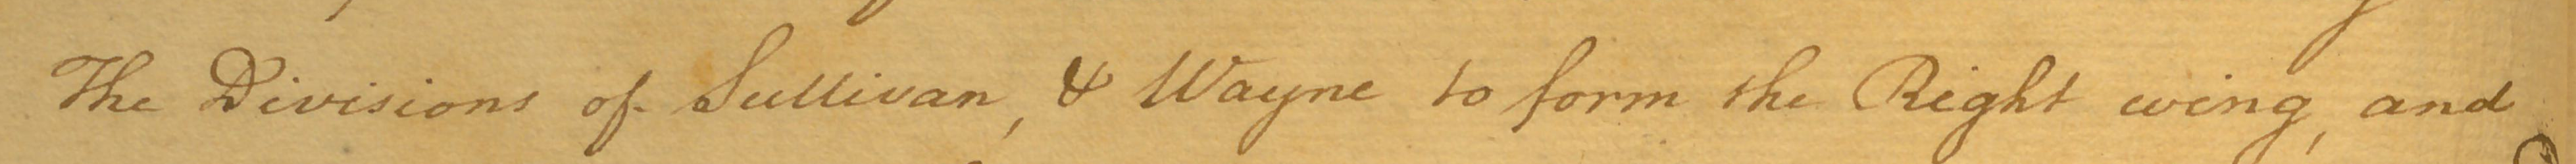The Divisions of Sullivan & Wayne to form the Right wing, and
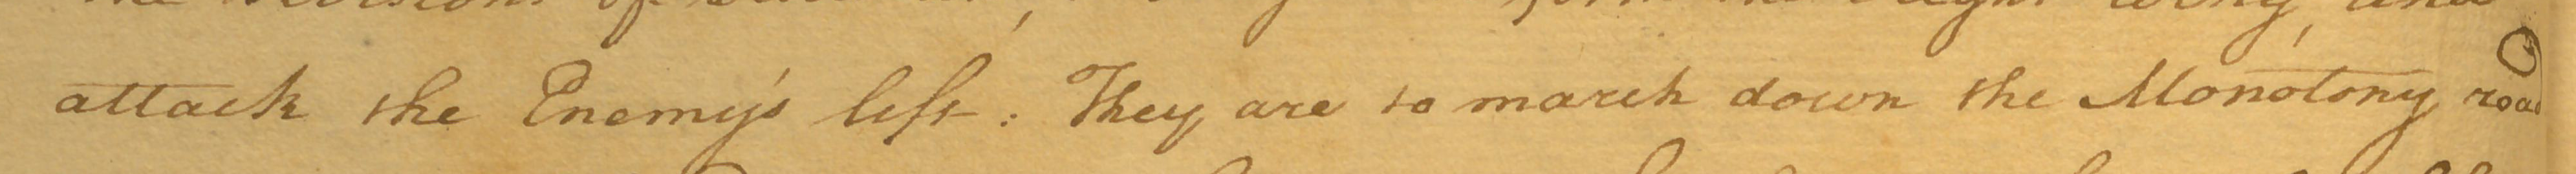attack the Enemy's left. They are to march down the Monotony road
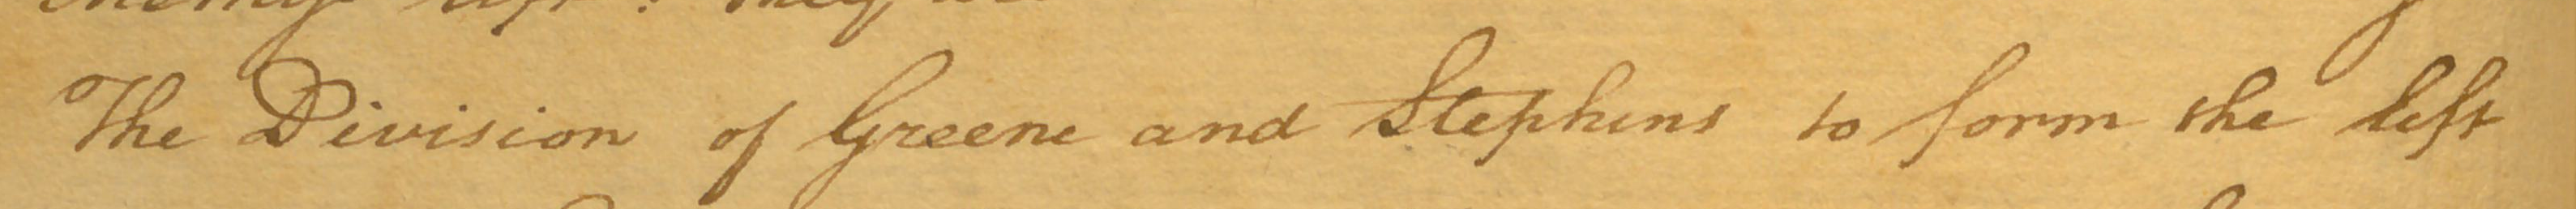The Division of Greene and Stephens to form the left
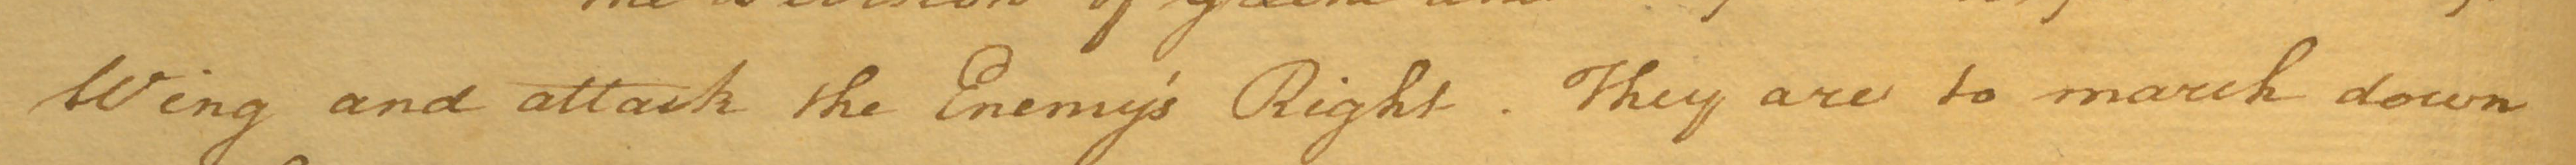Wing and attack the Enemy's Right. They are to march down
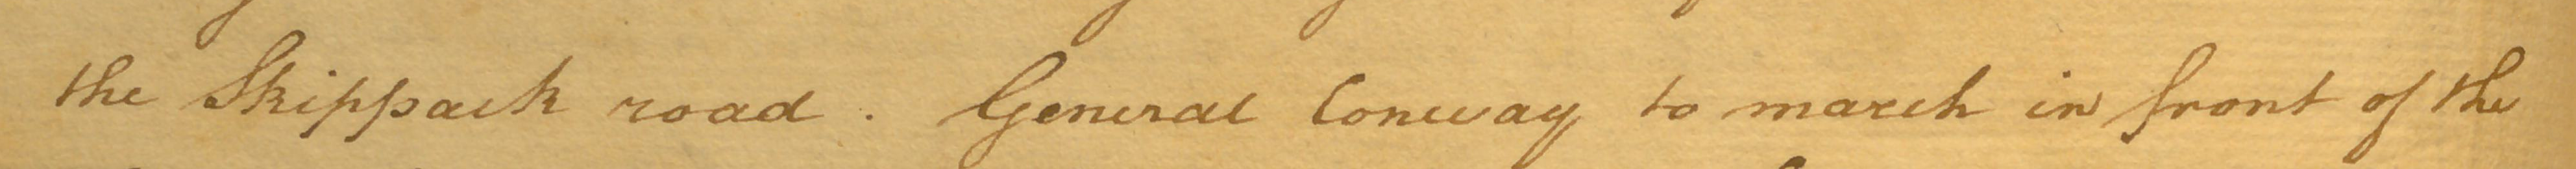the Skippack road. General Conway to march in front of the
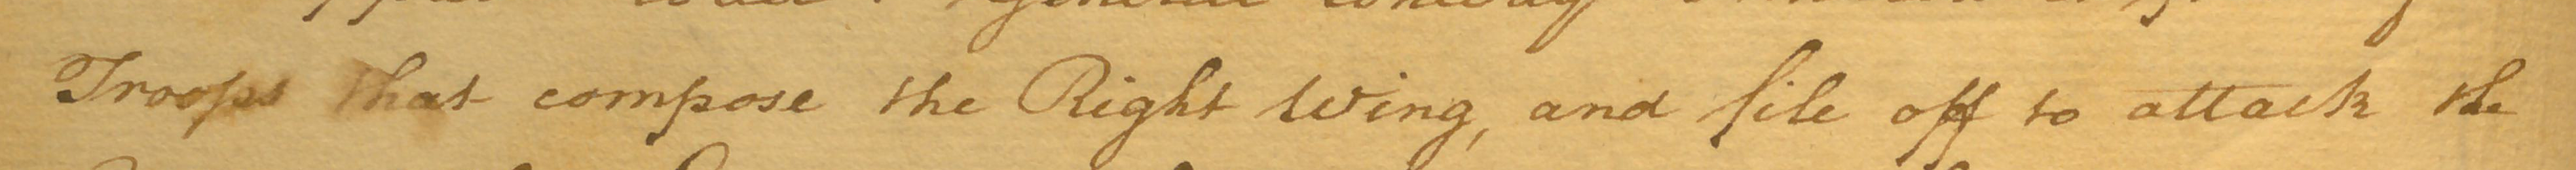Troops that compose the Right Wing, and file off to attack the
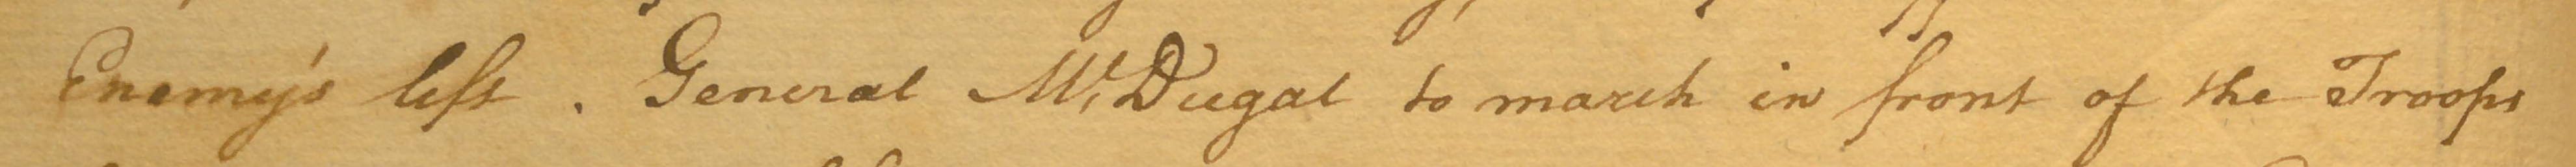Enemy's left. General M^cDugal to march in front of the Troops
